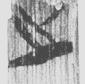之
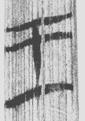王
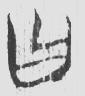曰
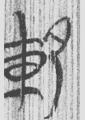𨊠（范）
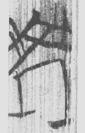{舛亼几}（乘）
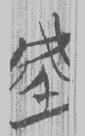𫊟（吾）
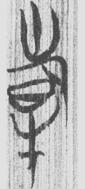幹（安）
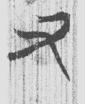又（有）
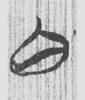白
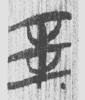玉
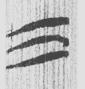三
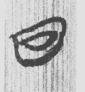回
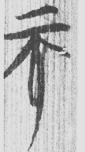而
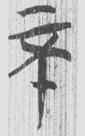不
